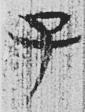子
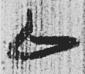㠯
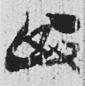○（賢）
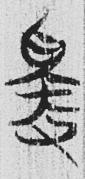爯（稱）
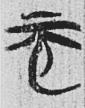而
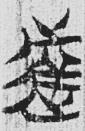○（失）
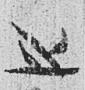之
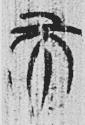天
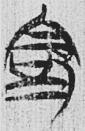命
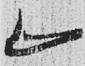㠯
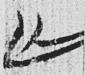亡
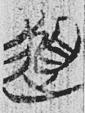道
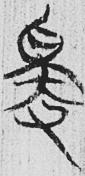爯（稱）
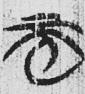而
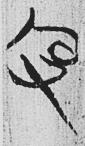○（沒）
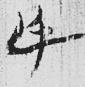身
